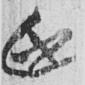臣
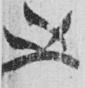之
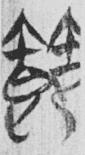節
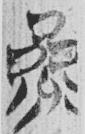參（三）
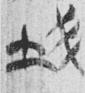○（郤）
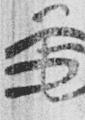𠁩
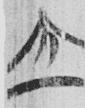立
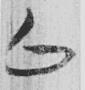㠯（以）
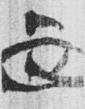正
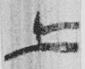上
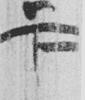下
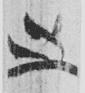之
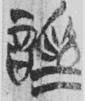譌
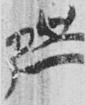○（強）
